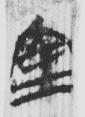寒
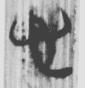心
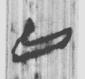㠯（以）
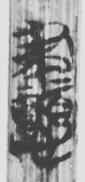{聿皕心}
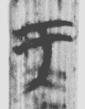于
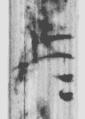上=
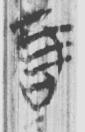唯
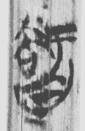智
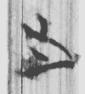之
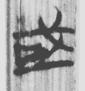或
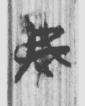弗
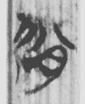{尸八月}
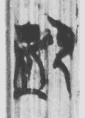卹
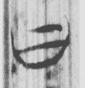曰
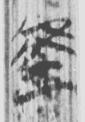𫊟
